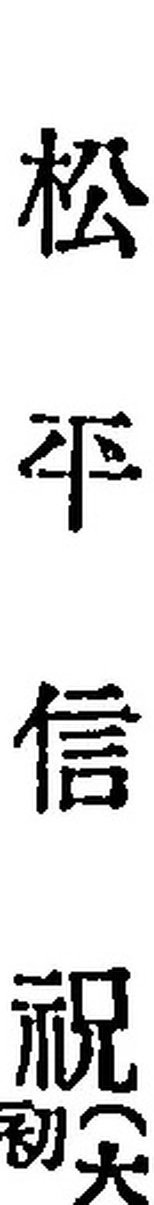松平信禮
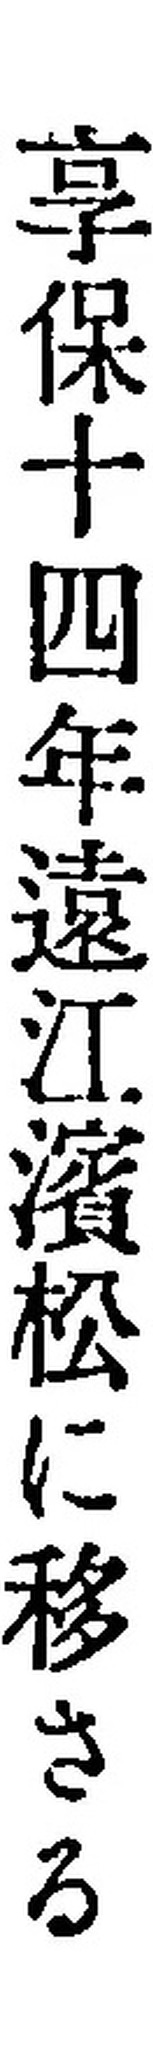享保十四年遠江濱松に移さる
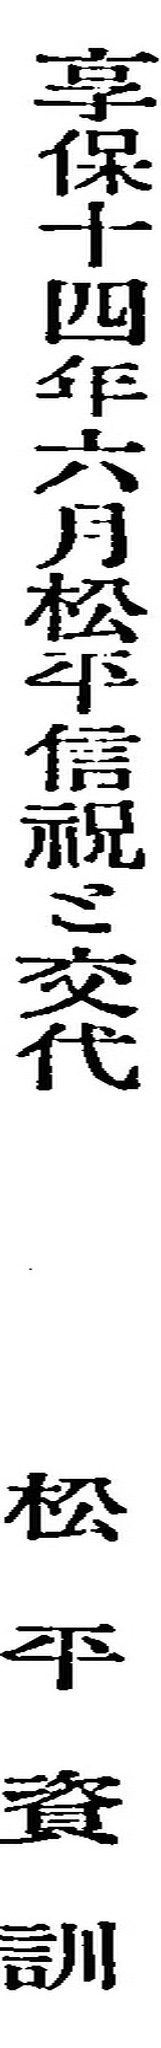享保十四年六月松平信祝と交代松平資訓
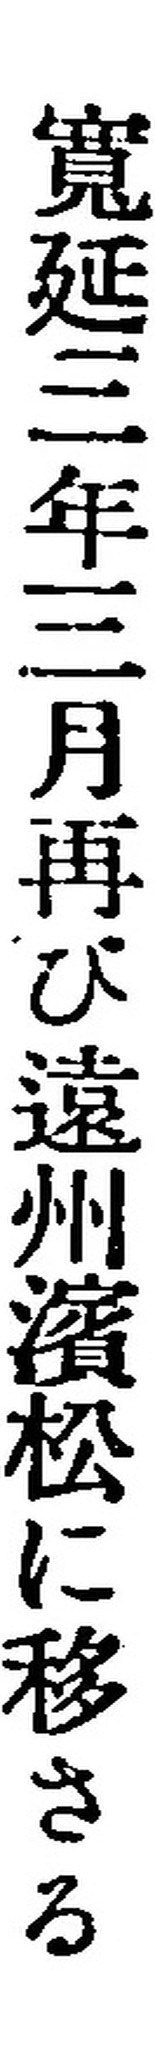寛延三年三月再び遠州濱松に移さる
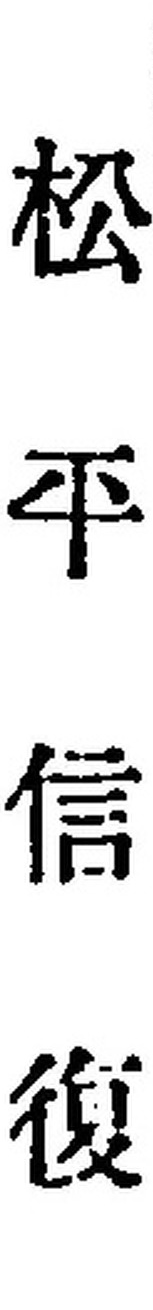松平信禮
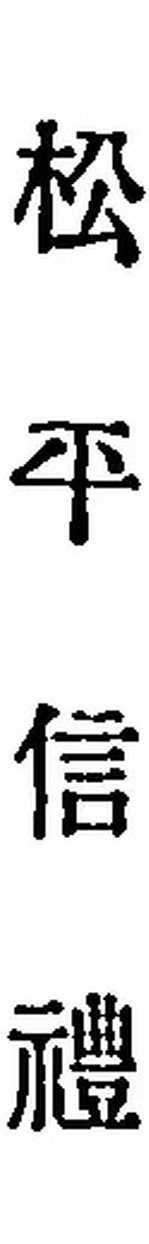松平信禮
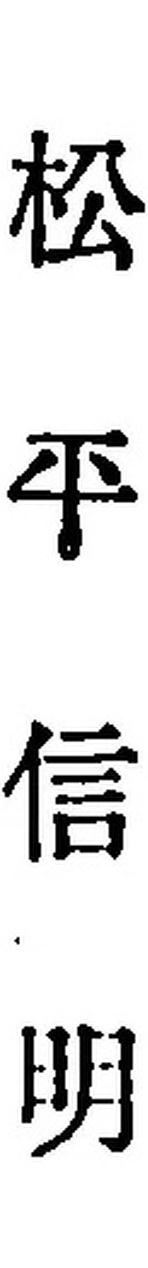松平信明
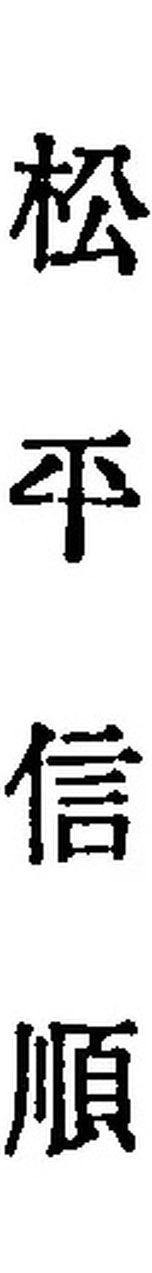松平信順
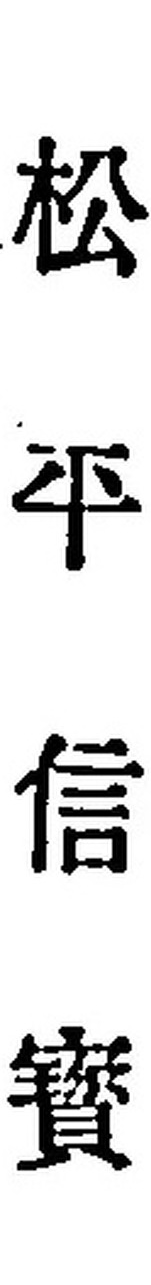松平信禮
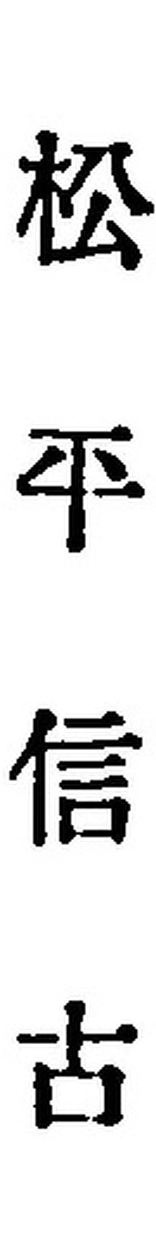松平信古
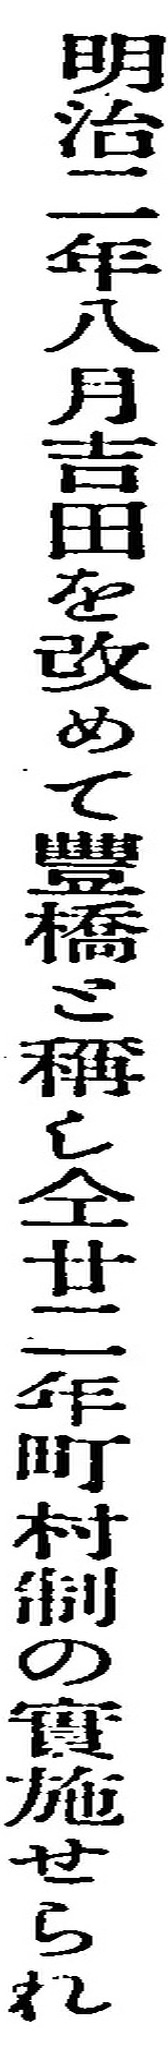明治二年八月吉田を改めて豐橋と稱し仝廿二年町村制の實施せられ
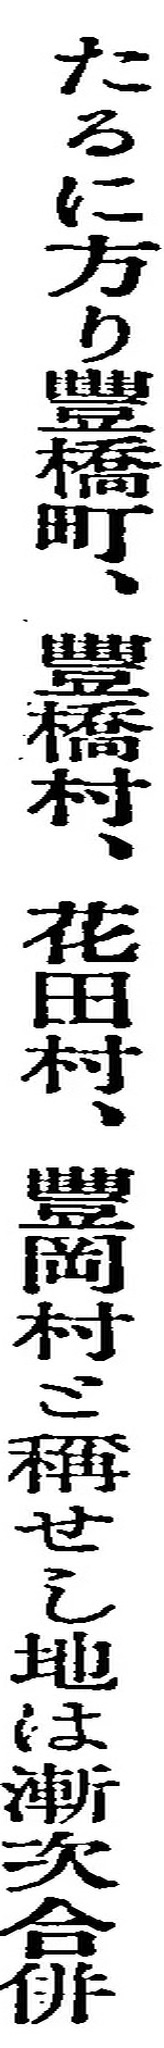たるに方り豐橋町、豐橋村、花田村、豐岡村と稱せし地は漸次合併
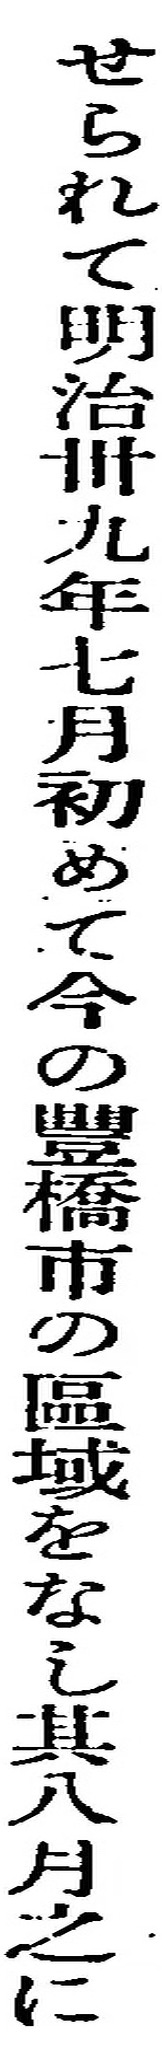せられて明治卅九年七月初めて今の豐橋市の區域をなし其八月之に

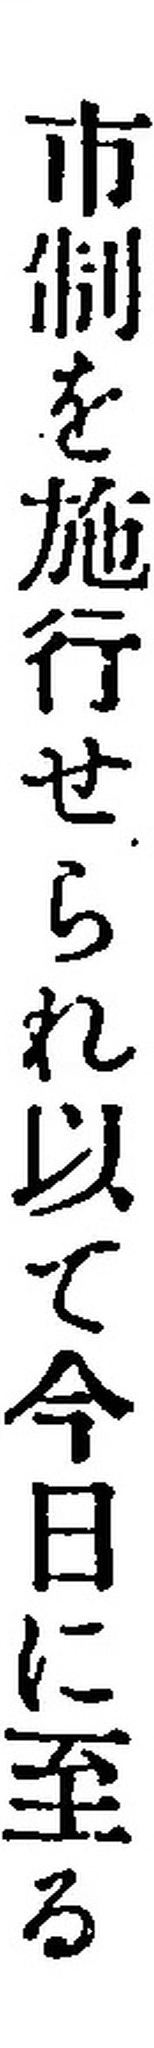市制を施行せられ以て今日に至る
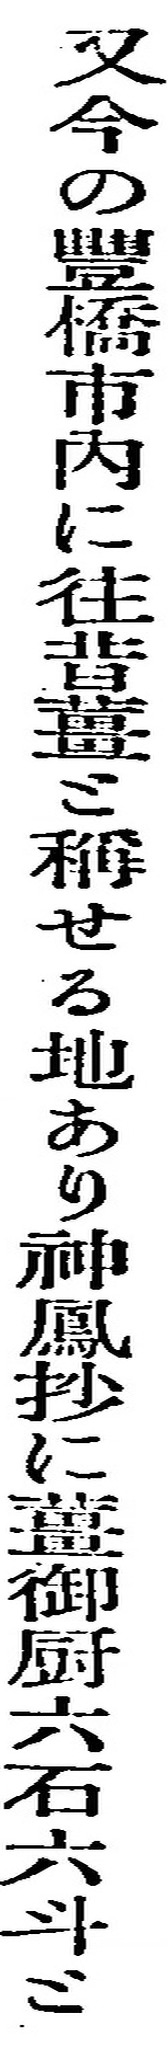又今の豐橋市内に往昔薑と稱せる地あり神鳳抄に薑御厨六石六斗と
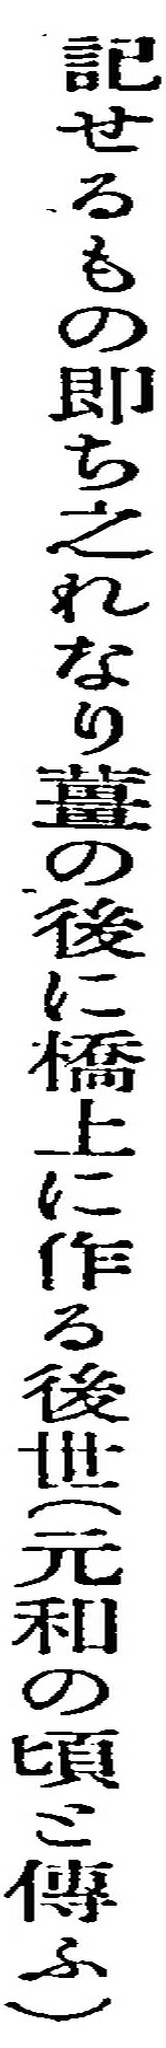記せるもの即ち之れなり薑の後に橋上に作る後世(元和の頃と傳ふ)
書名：豊橋志要
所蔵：国立国会図書館 National Diet Library, JAPAN
